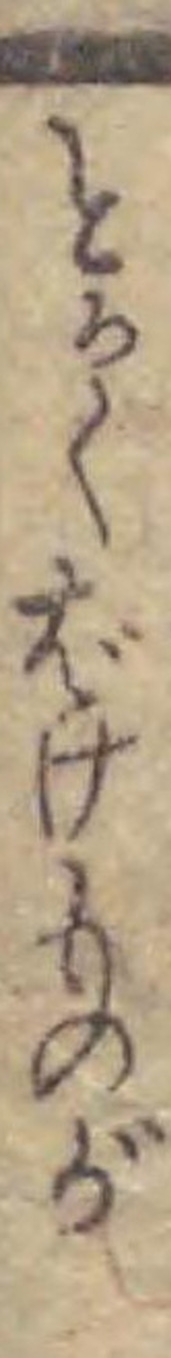とかくばけものが
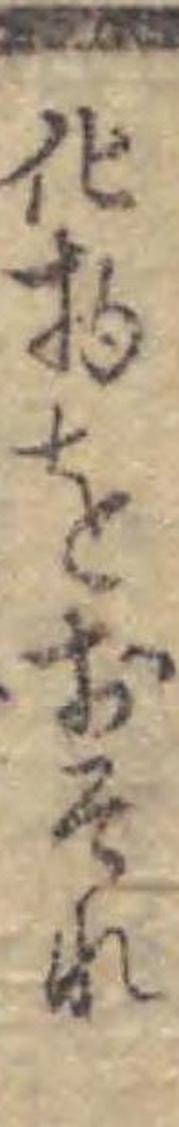化物をおそれ
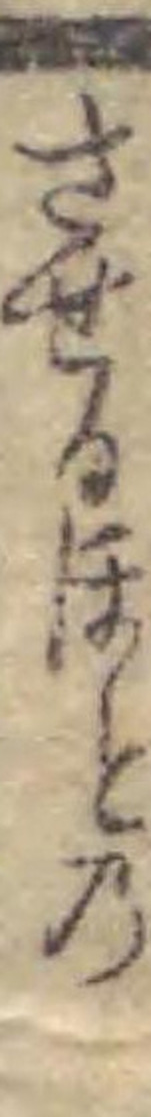させるほどの
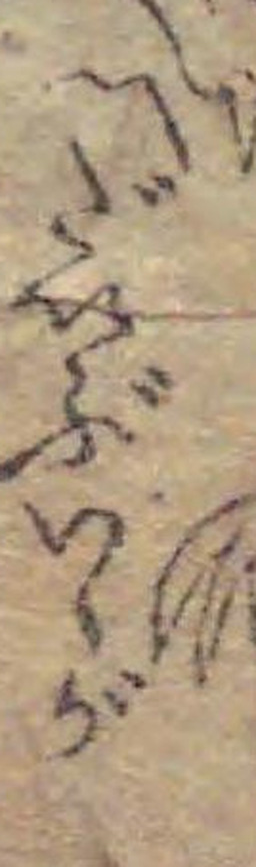〽だいぶいゝが
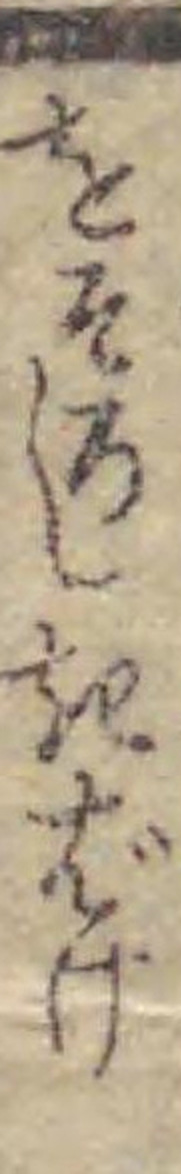をそろしきばけ
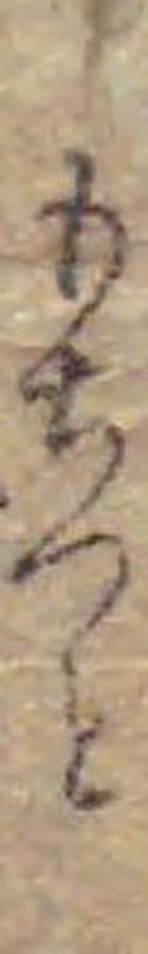もちつと
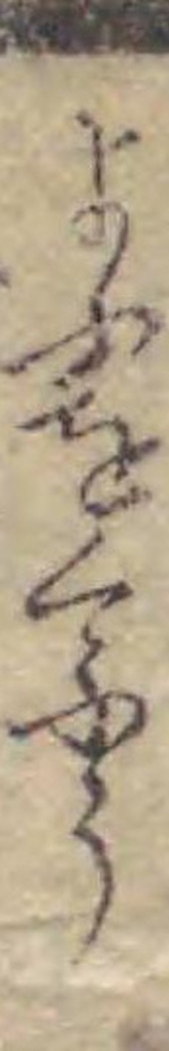よふをくふう
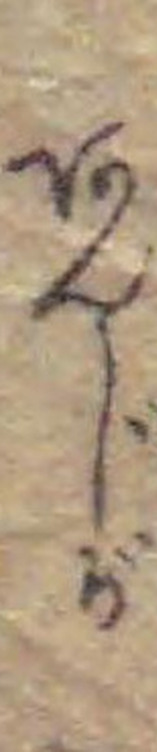あんじが
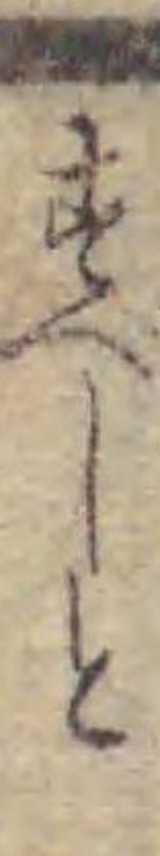すべしと
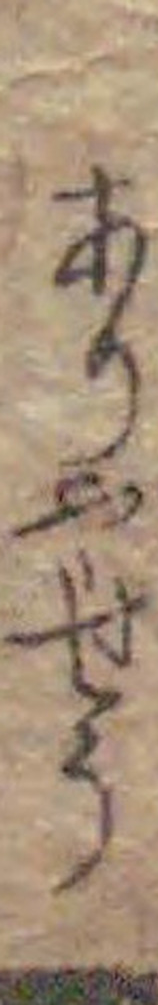ありやせう
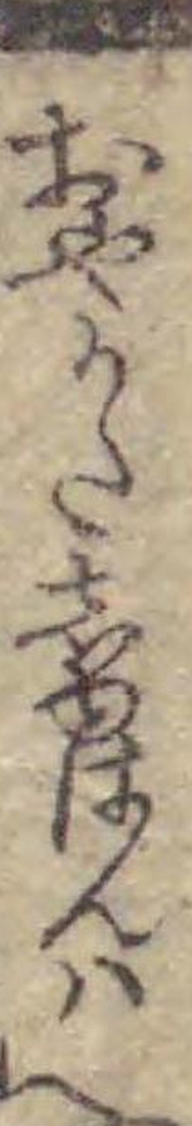おやかたしゆはんは
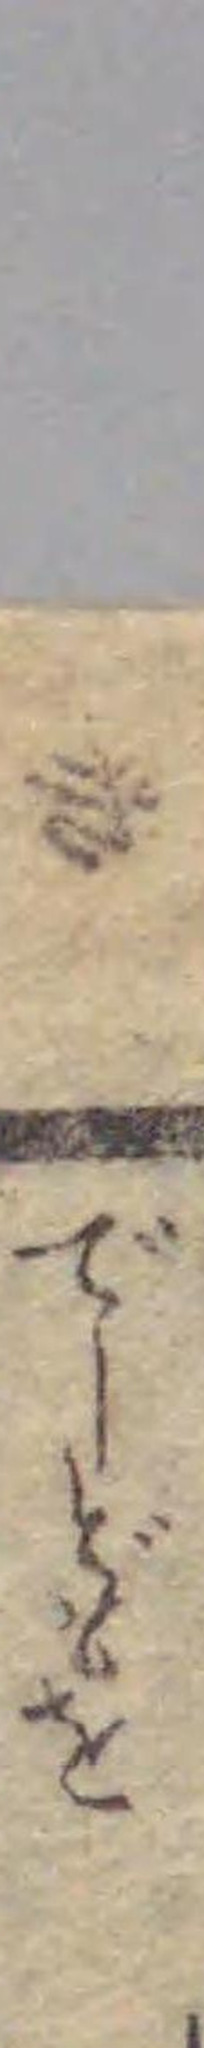でしどもを
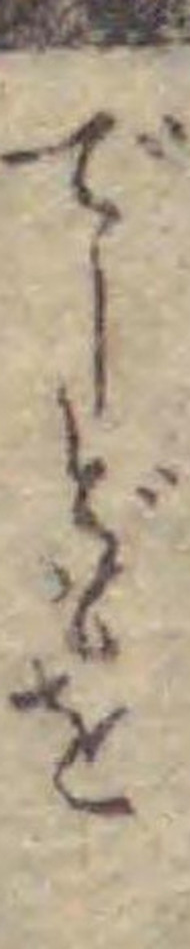でしどもを
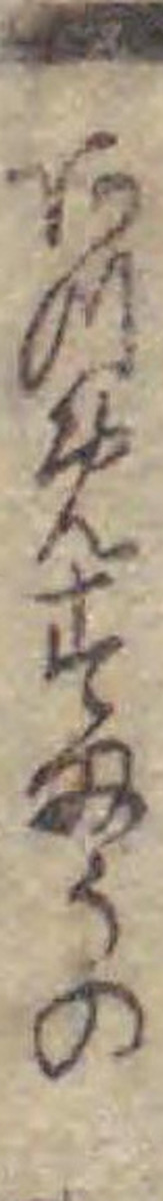あつめすまうの
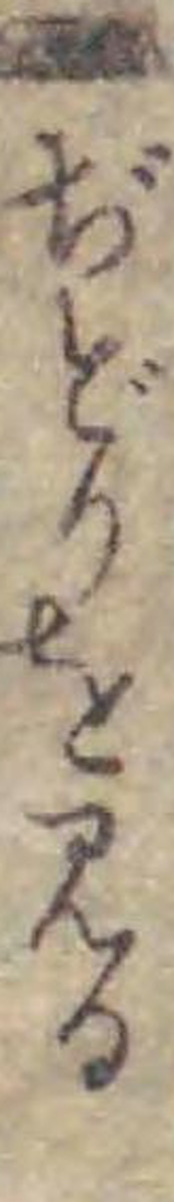ぢどりを見る
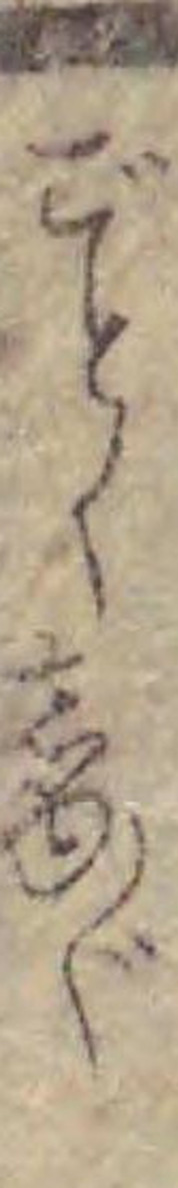ごとくしゆ〴〵
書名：化物世界夜半嵐 : 3巻
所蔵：国立国会図書館 National Diet Library, JAPAN
